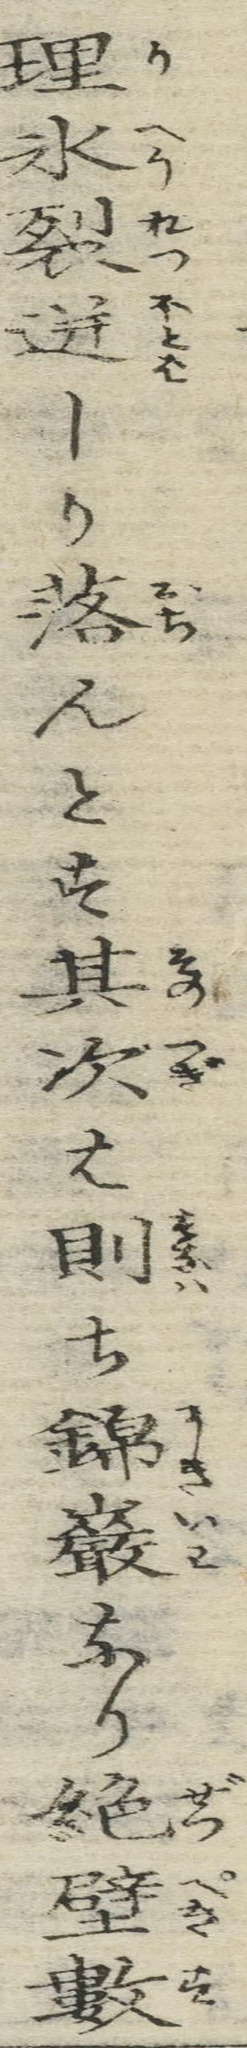理氷裂迸しり落んとす其次は則ち錦巌なり絶壁数
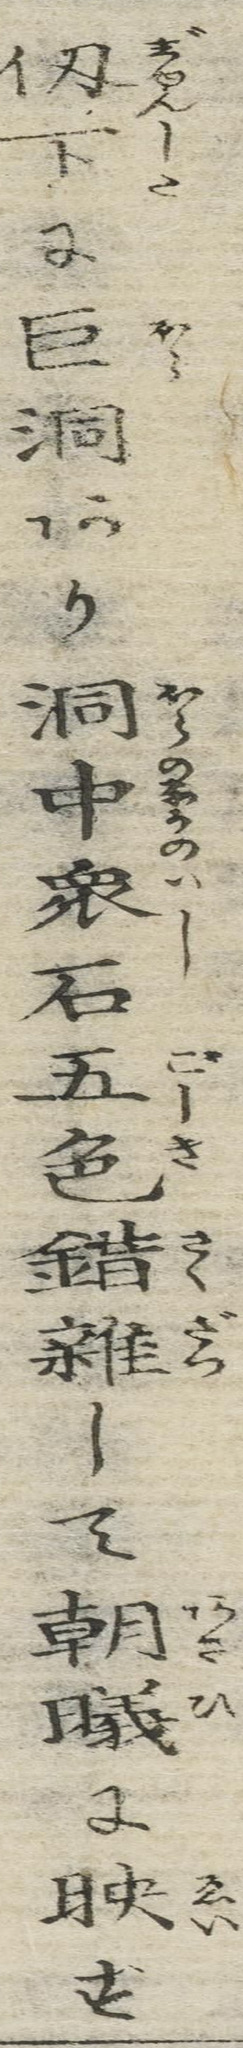仭下に巨洞あり洞中衆石五色錯雑して朝曦に映す
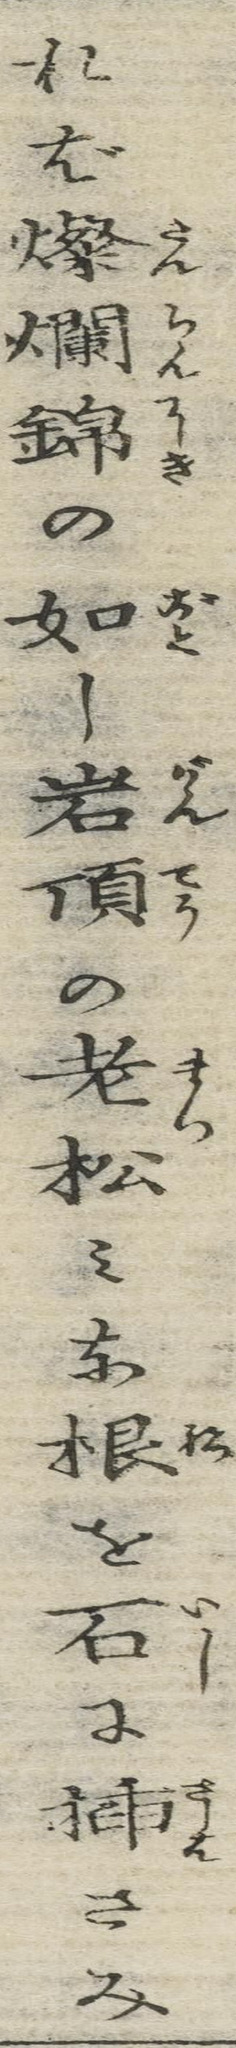れば燦爛錦の如し岩頂の老松みな根を石に挿さみ
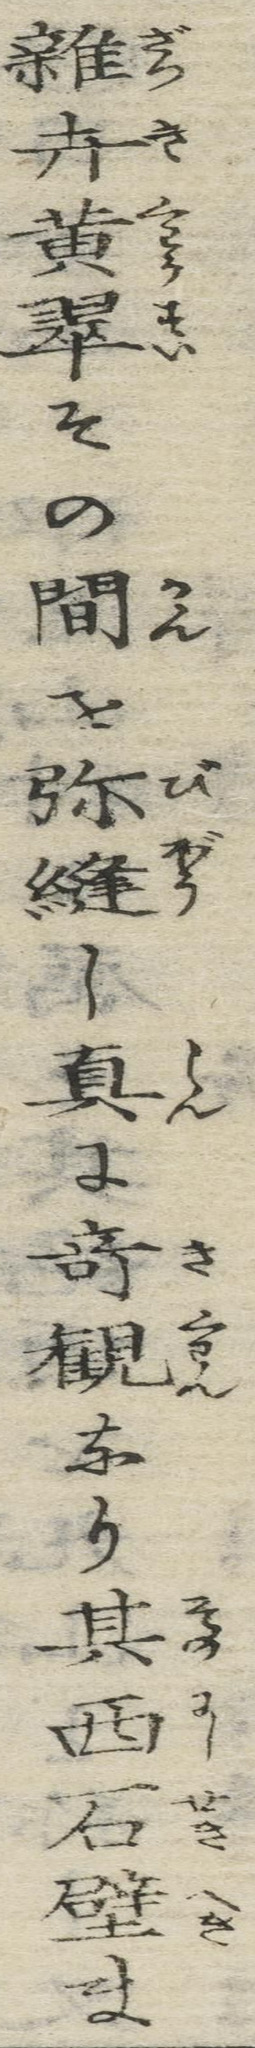雑卉黄翠その間を弥縫し真に奇観なり其西石壁ま
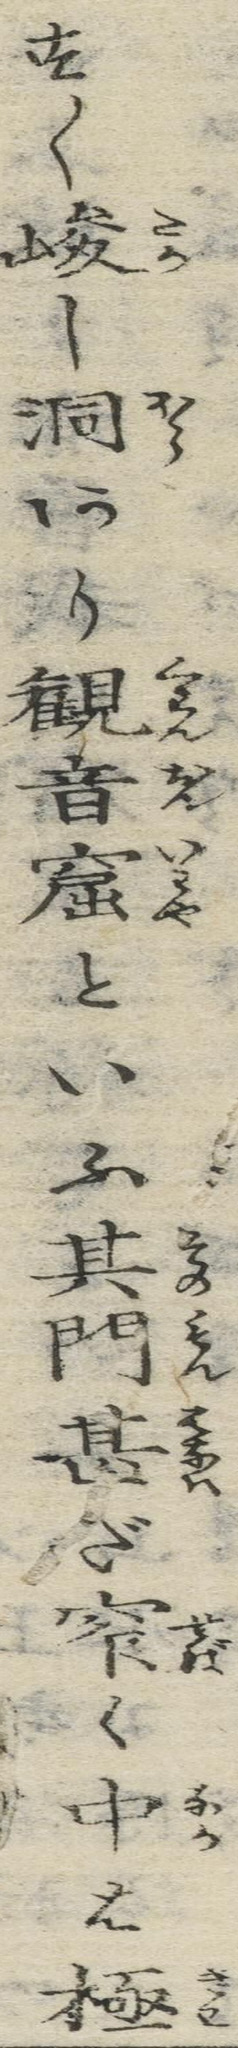す〳〵峻し洞あり観音窟といふ其門甚だ窄く中は極
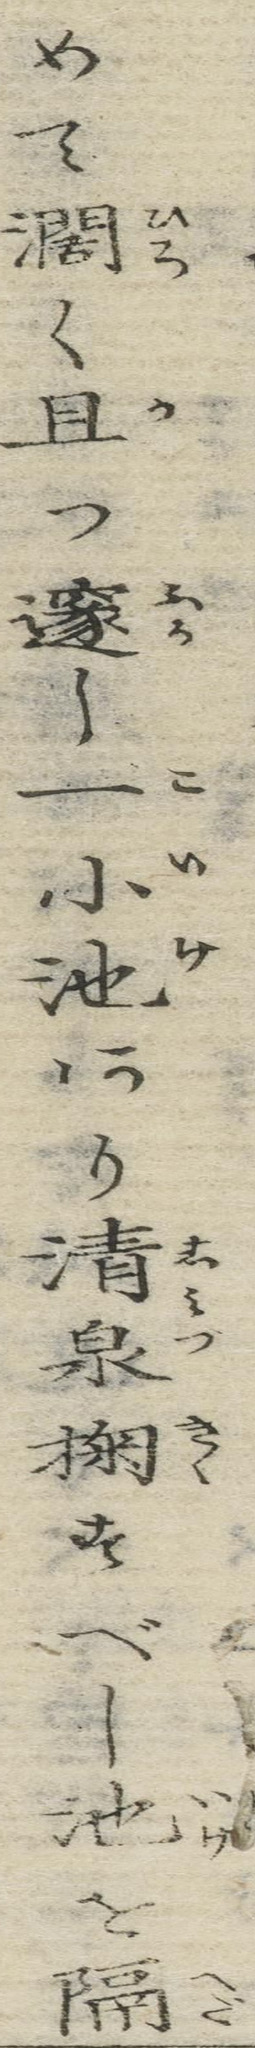めて濶く且つ邃し一小池あり清泉掬すべし池を隔
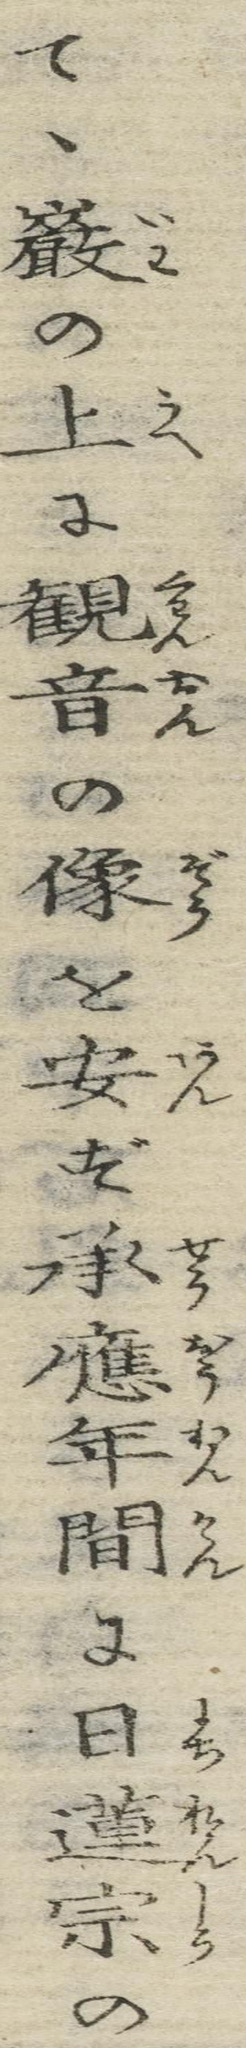てゝ巌の上に観音の像を安ず承応年間に日蓮宗の

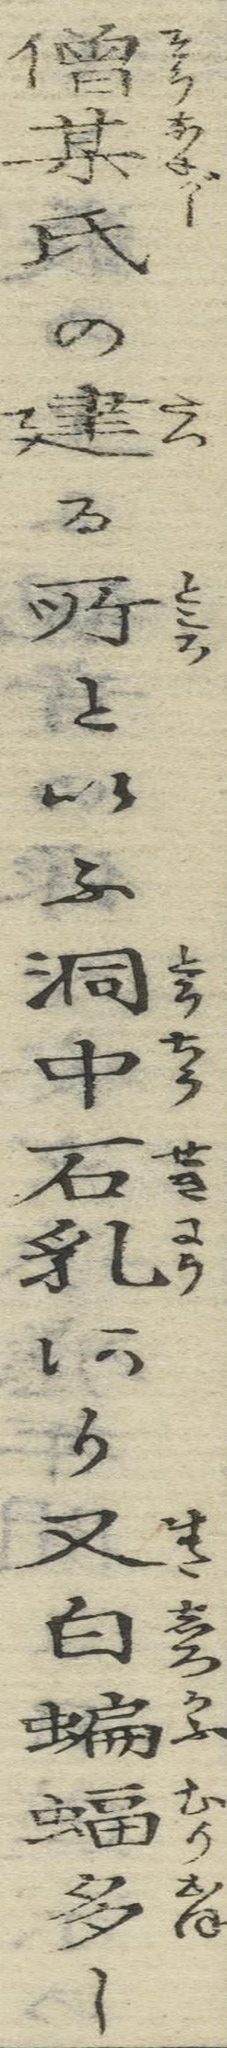僧某氏の建る所といふ洞中石乳あり又白蝙蝠多し
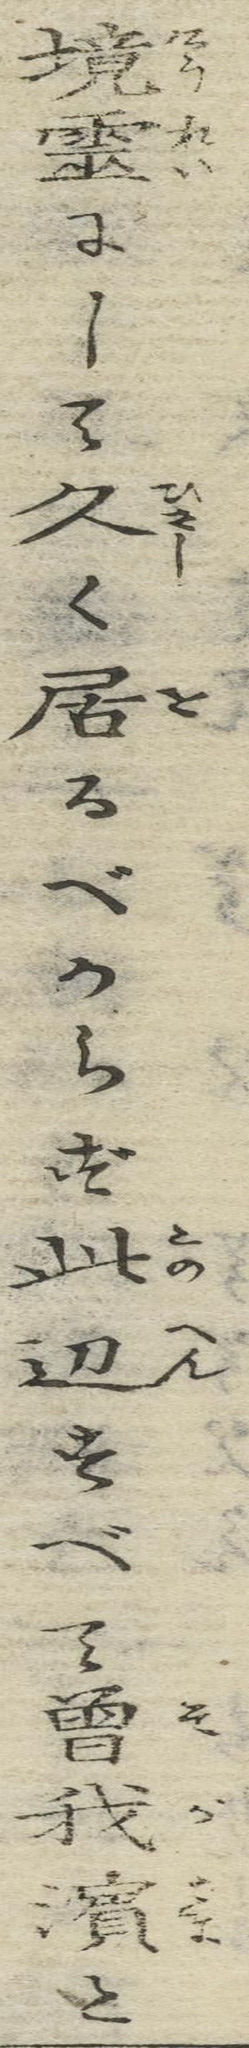境霊にして久く居るべからず此辺すべて曽我浜と
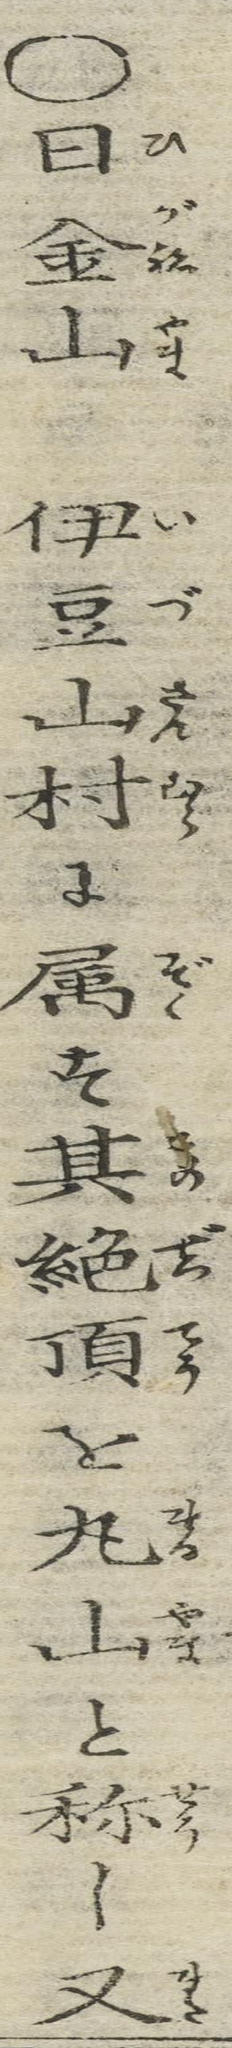○日金山伊豆山村に属す其絶頂を丸山と称し又
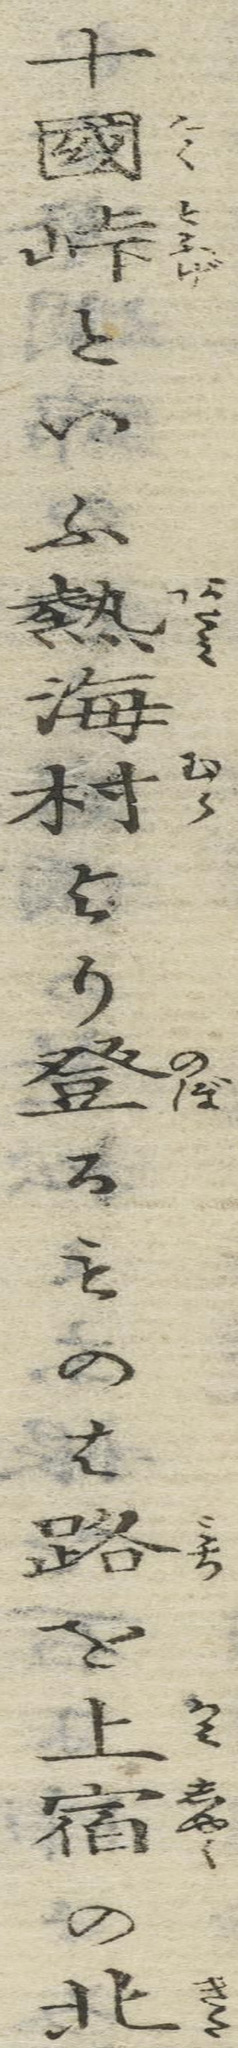十国峠といふ熱海村より登るものは路を上宿の北
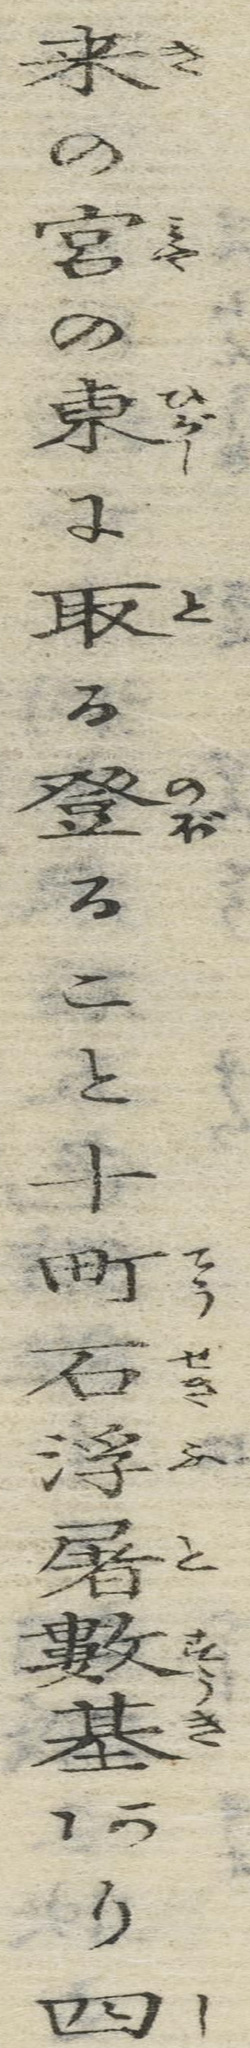来の宮の東に取る登ること十町石浮屠数基あり四
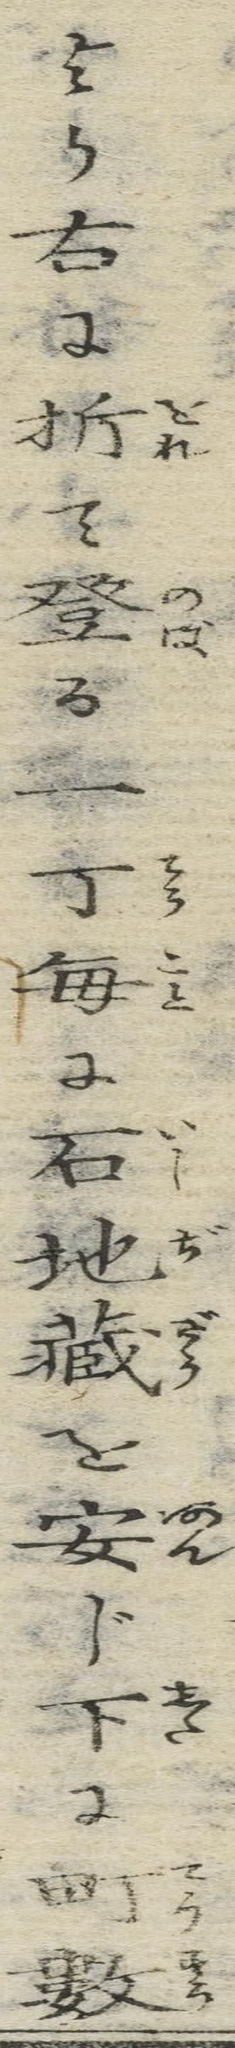より右に折て登る一丁毎に石地蔵を安じ下に町数
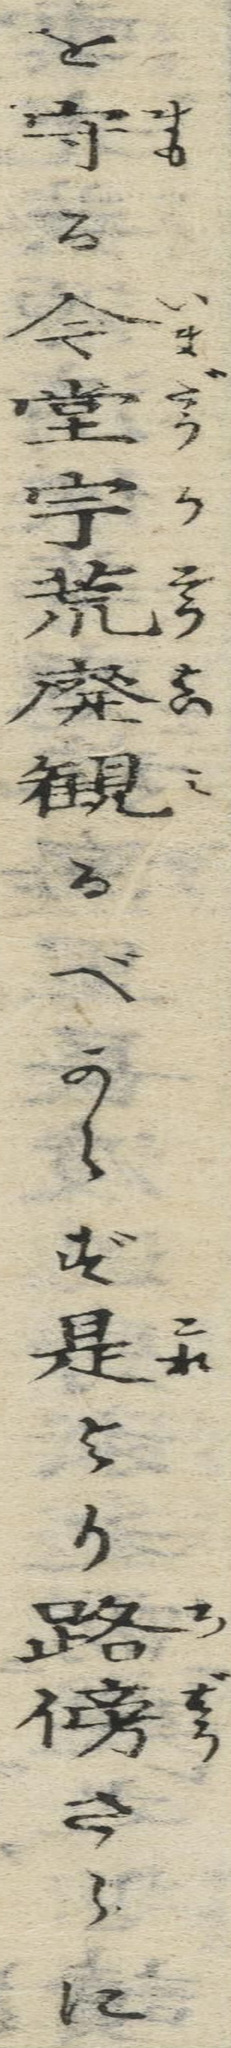を守る今堂宇荒廃観るべからず是より路傍さらに
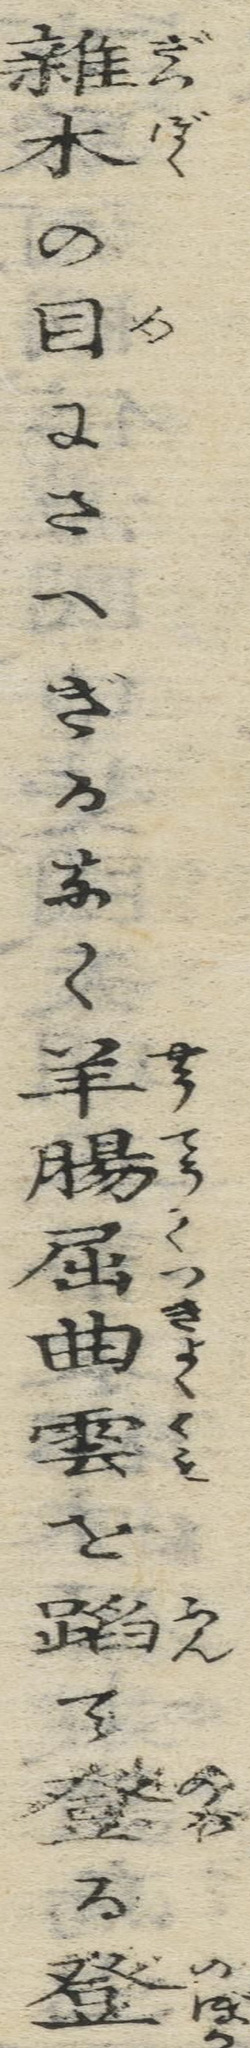雑木の目にさへぎるなく羊腸屈曲雲を踏で登る登
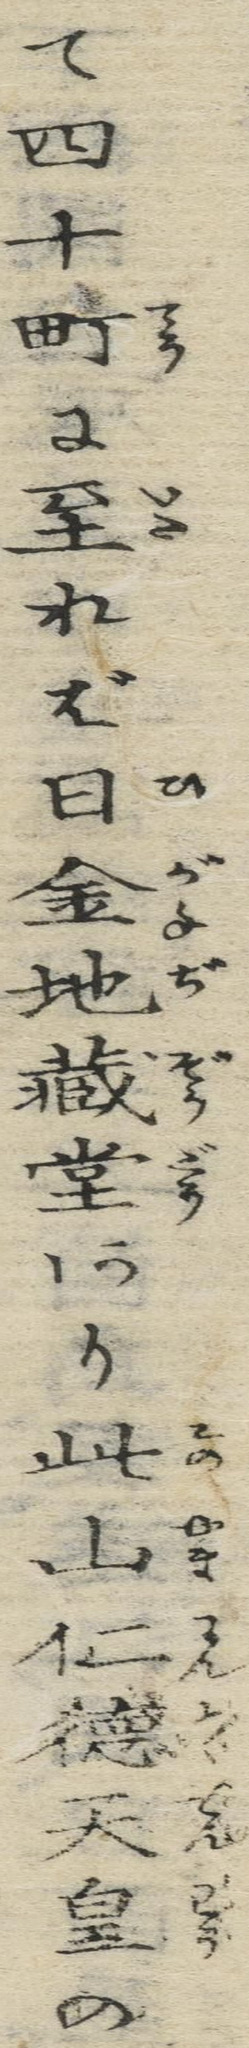て四十町に至れば日金地蔵堂あり此山仁徳天皇の
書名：豆州熱海誌　完
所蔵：東京大学地震研究所図書室 Earthquake Research Institute Library, The University of Tokyo, JAPAN
